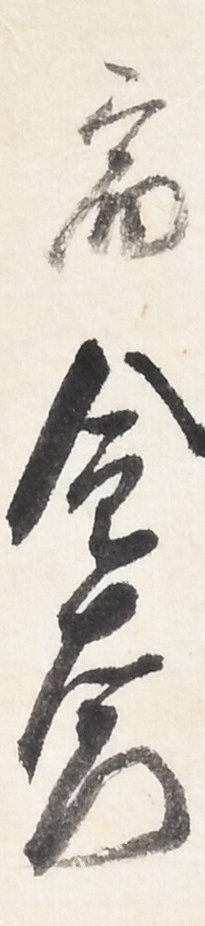宿金右衛門
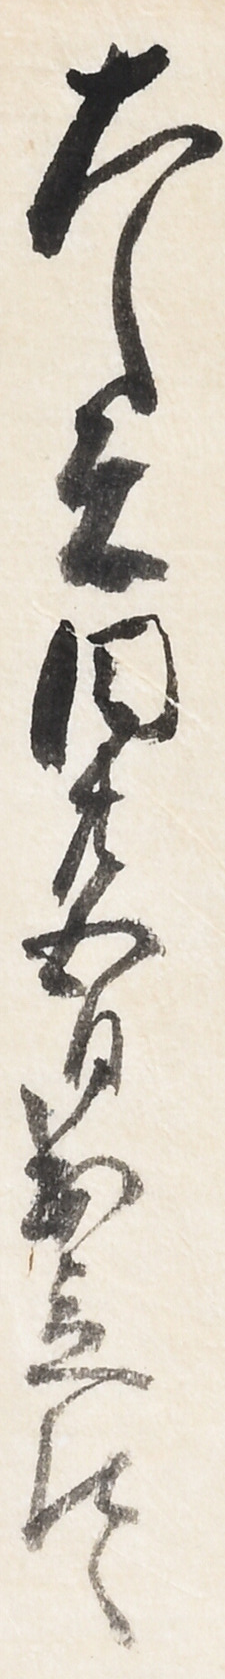右之者同廿五日出立仕候
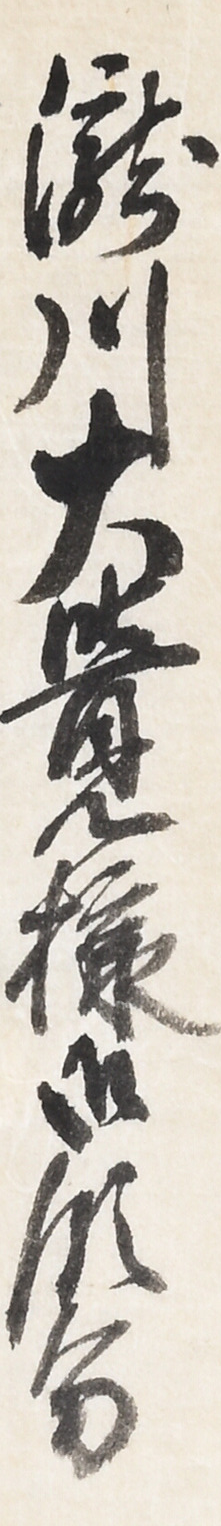瀧川大学様御領分
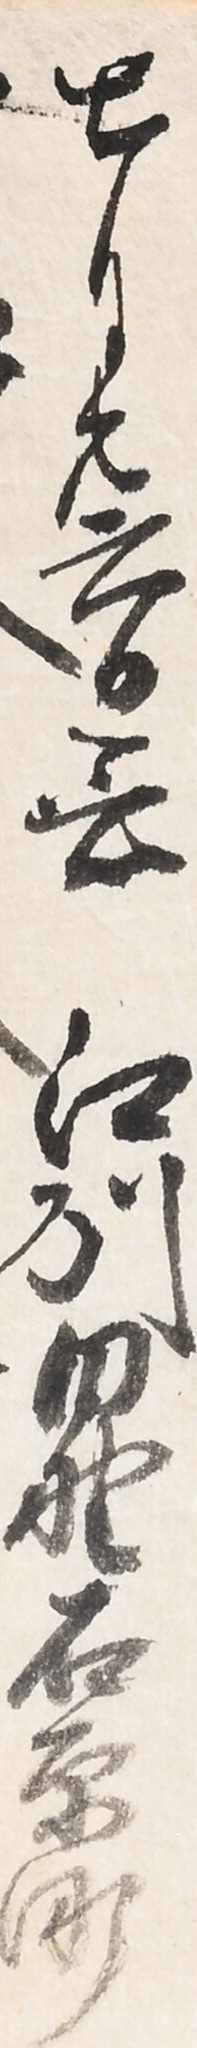七月廿六日着江州日野石原町
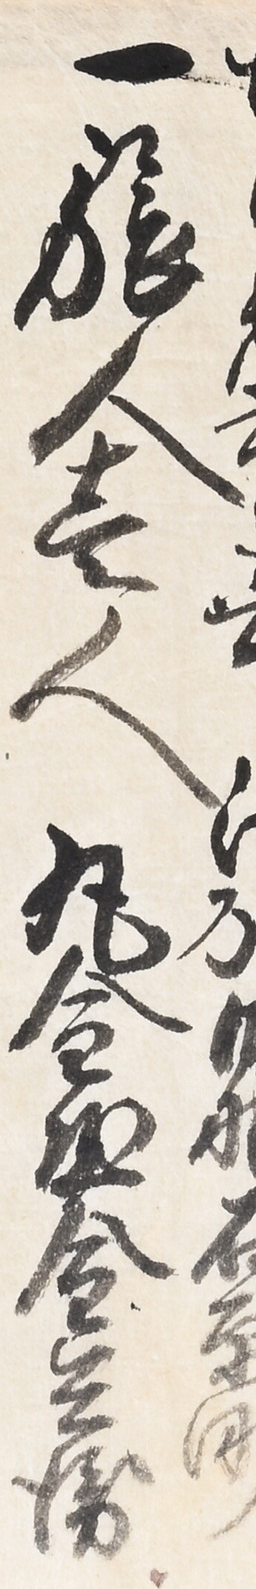一旅人壱人丸金屋金兵衛
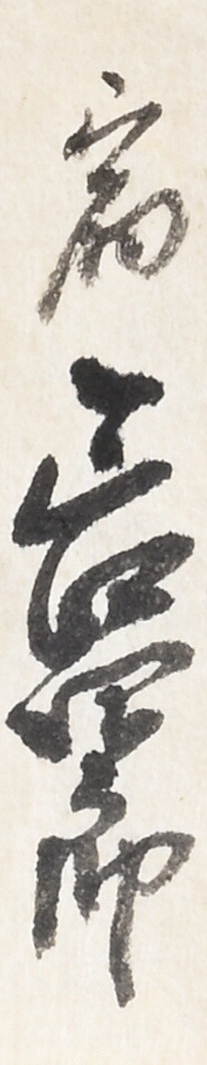宿善四郎
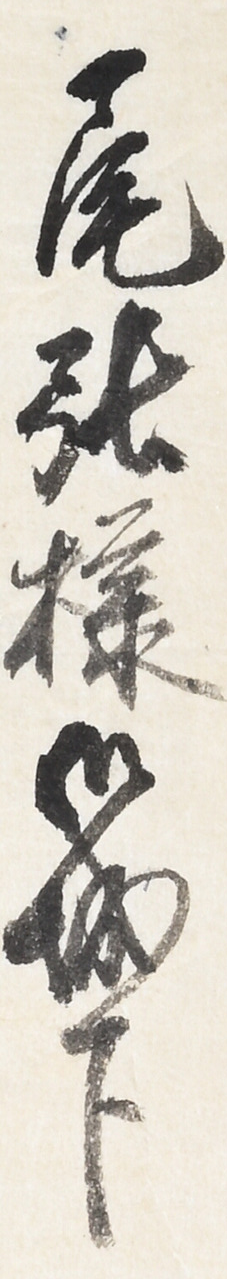尾張様御城下
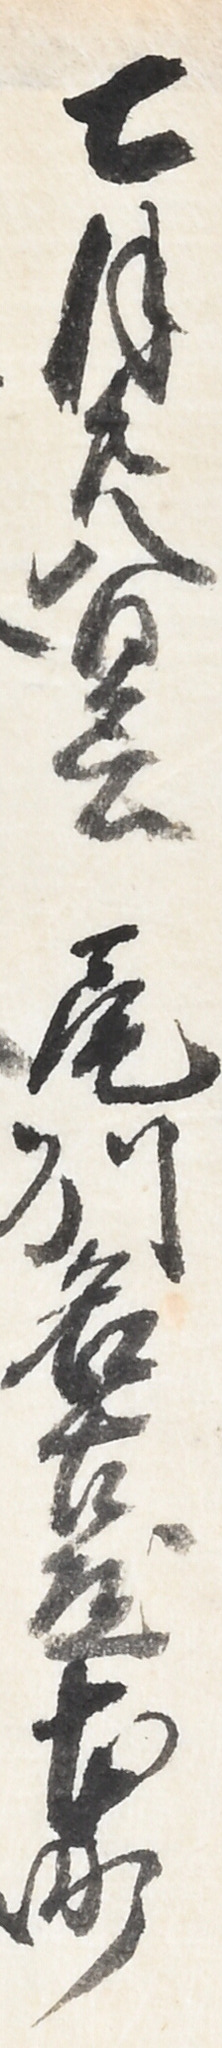七月廿八日着尾州名古屋本町
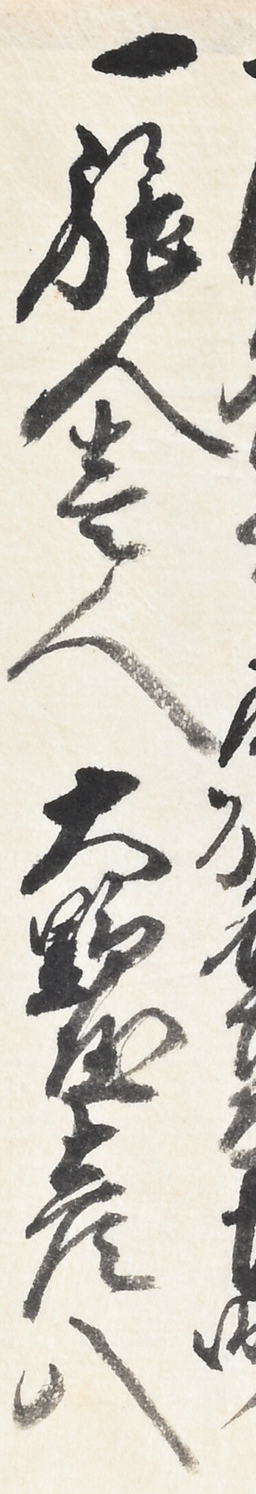一旅人壱人大野屋彦八
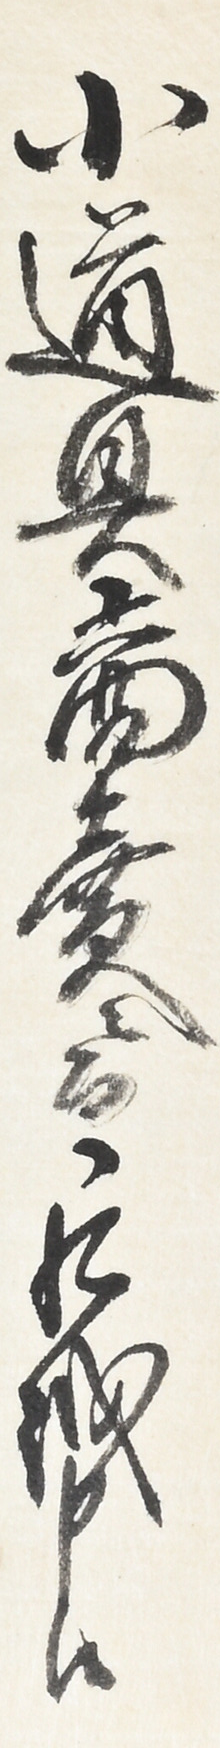小道具商売ニ而罷越申候
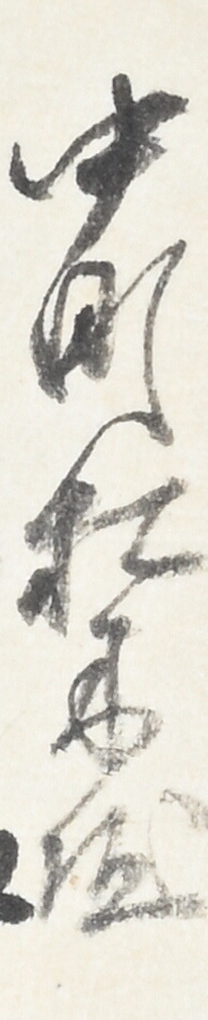中町松木屋
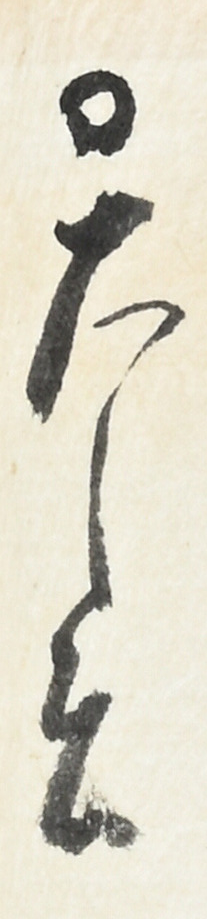〇右之者

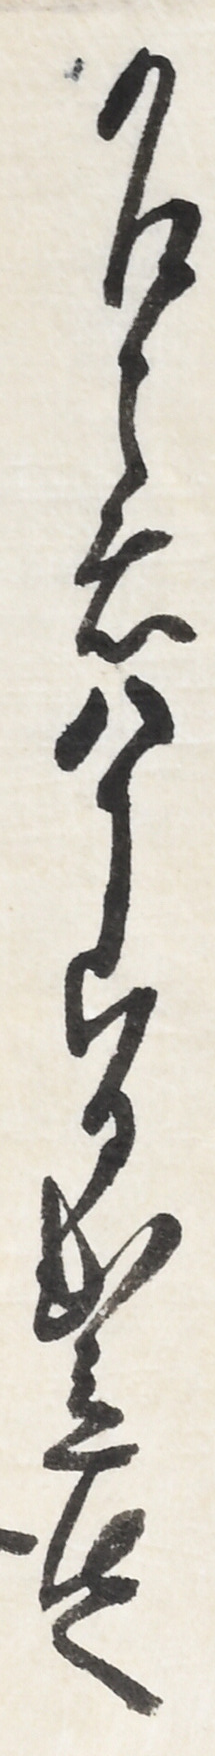右之者八月八日出立仕候
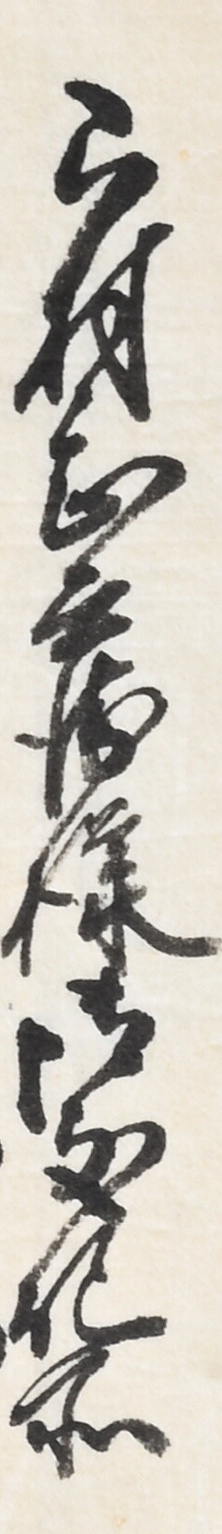山村甚兵衛様御支配所
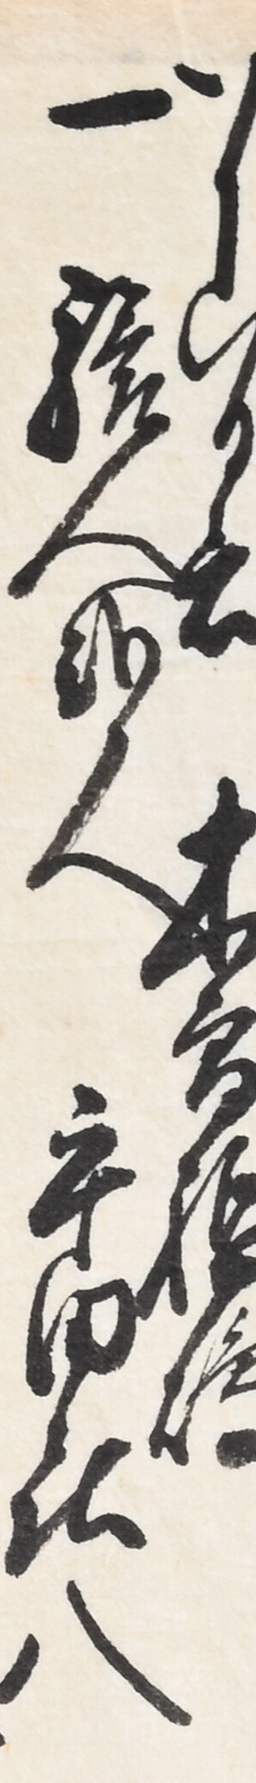一旅人弐人市田喜八
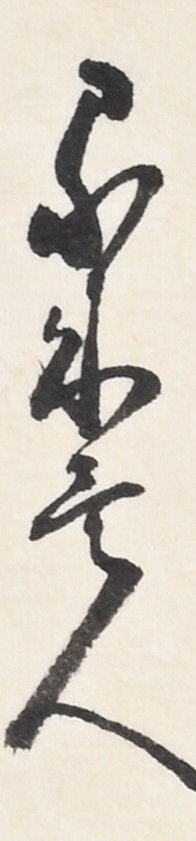家来壱人
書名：旅人泊控帳
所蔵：伊那市立高遠町図書館・合同会社AMANE
